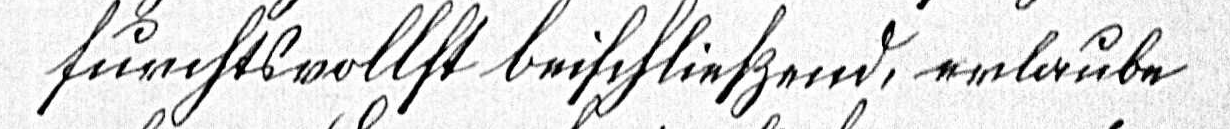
furchtsvollst beschließend, erlaube
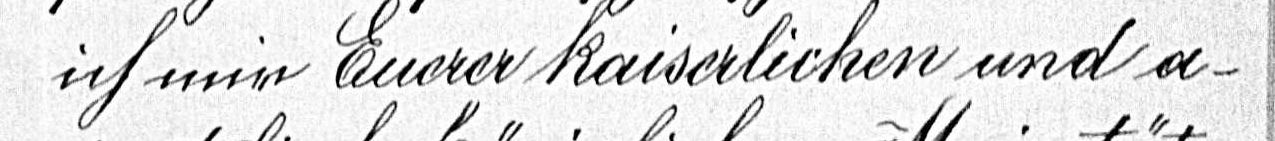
ich mir Euerer kaiserlichen und a¬
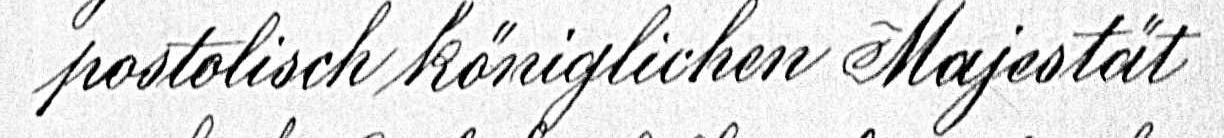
postolisch königlichen Majestät
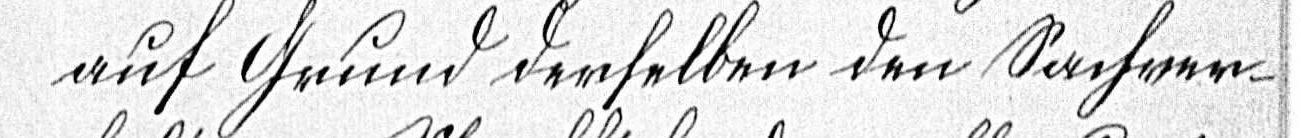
auf Grund derselben den Sachver¬
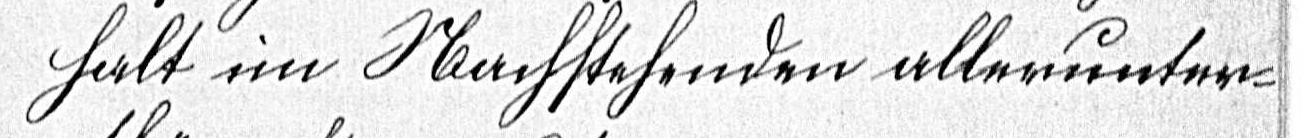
halt im Nachstehenden allerunter¬
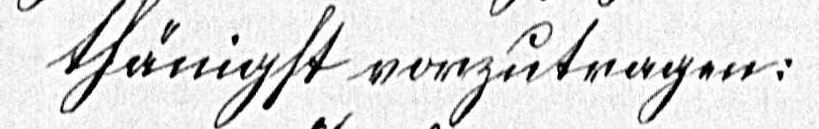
thänigst vorzutragen:
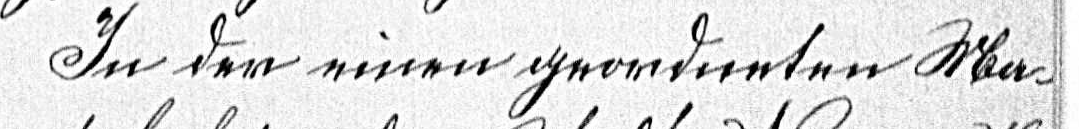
In der einen geordneten Ma¬
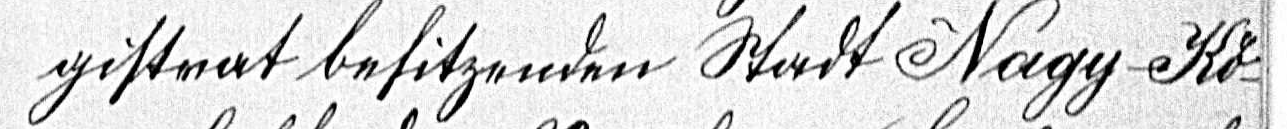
gistrat besitzenden Stadt Nagy-Kő¬
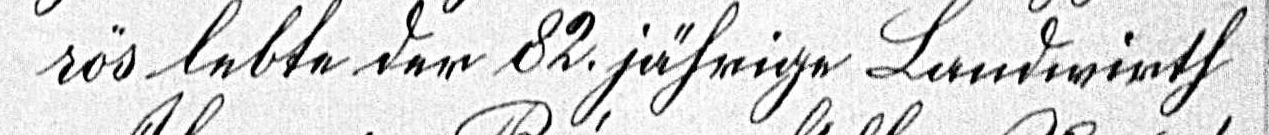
rös lebte der 82. Jährige Landwirth
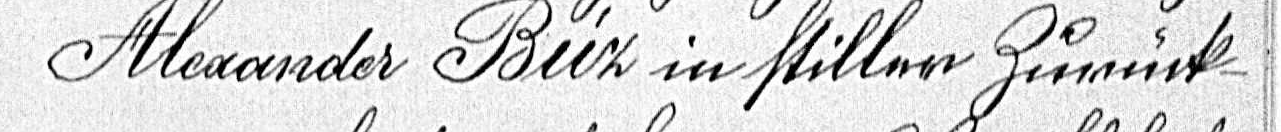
Alexander Búz in stiller Zurück¬
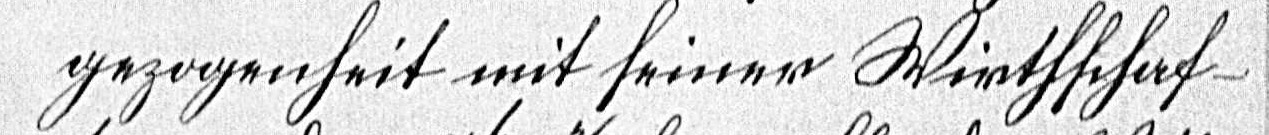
gezogenheit mit seiner Wirtschaf¬
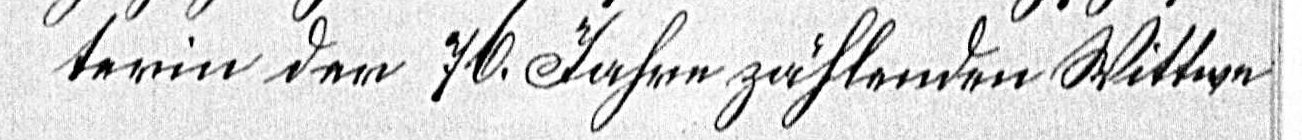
terin der 76. Jahre zählenden Wittwe
